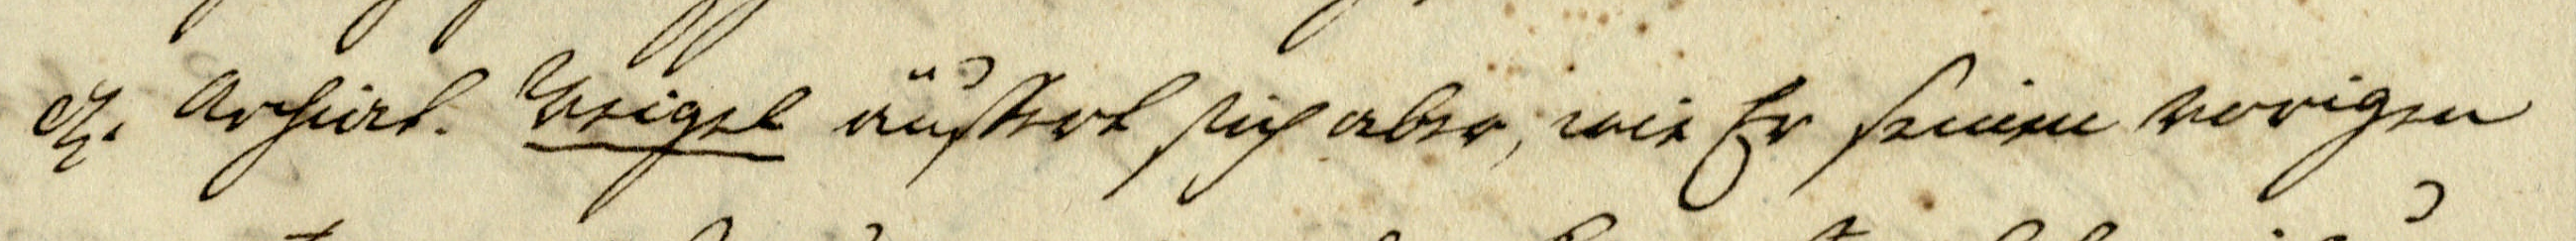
dh. Archiat. Weigel äussert sich aber, wie Er seinen vorigen
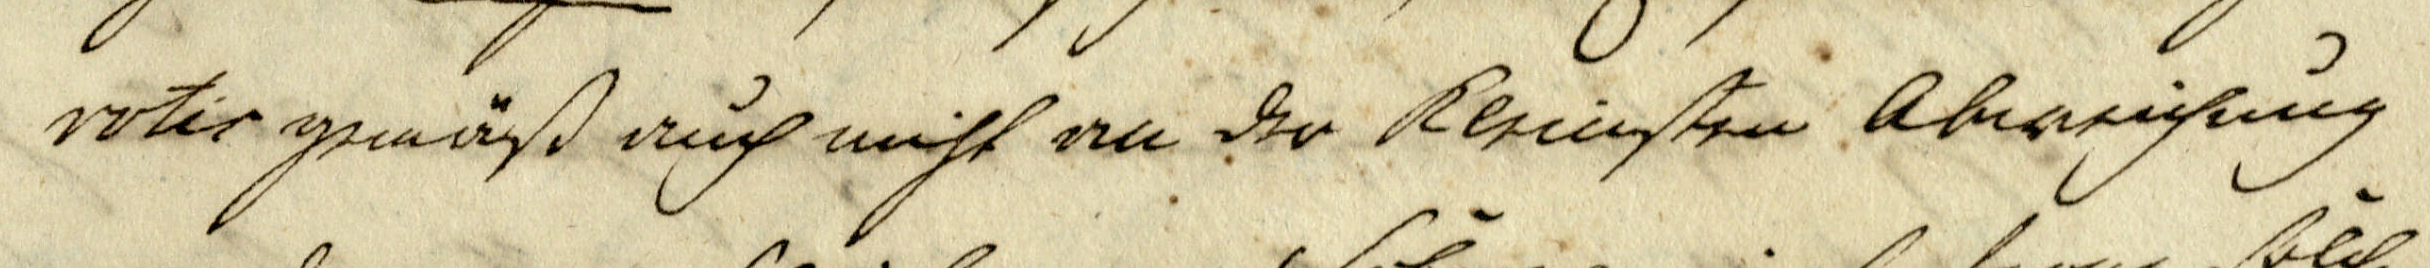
votis gemäß auch nicht an der kleinsten Abweichung
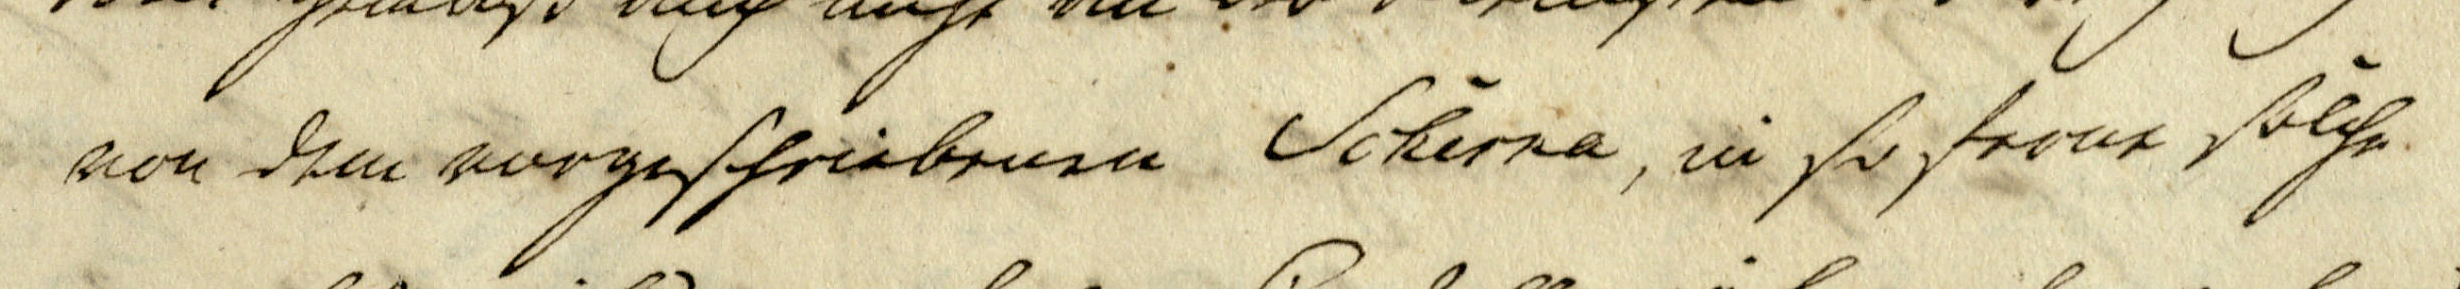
von dem vorgeschriebenen Schema, in so ferne solche
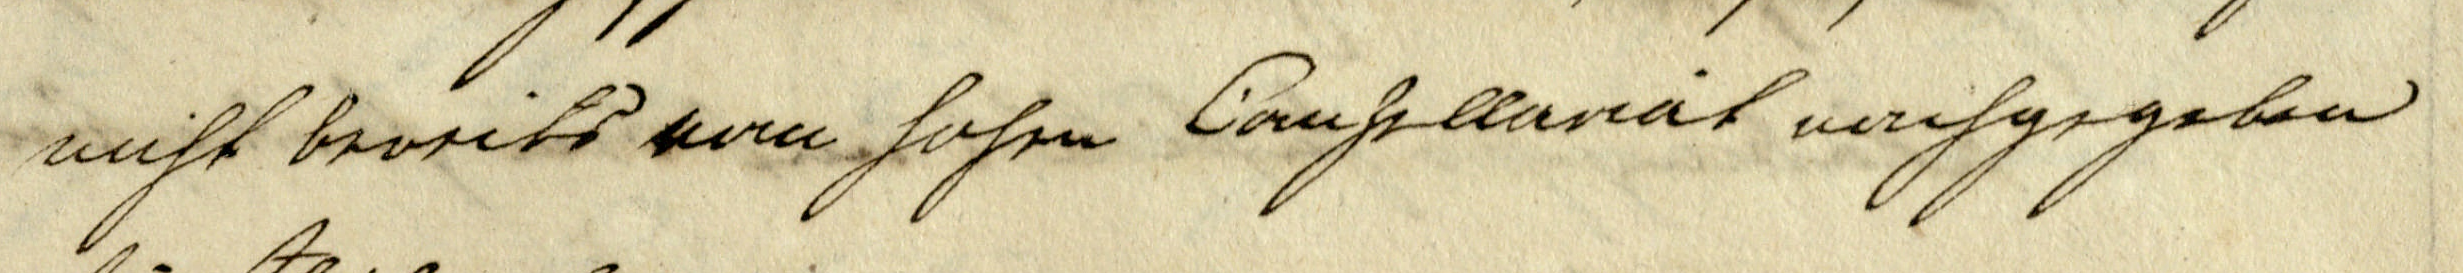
nicht bereits vom hohen Canzellariat nachgegeben
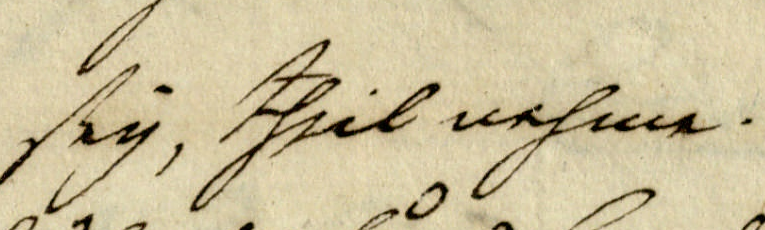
seÿ, Theil nehme.
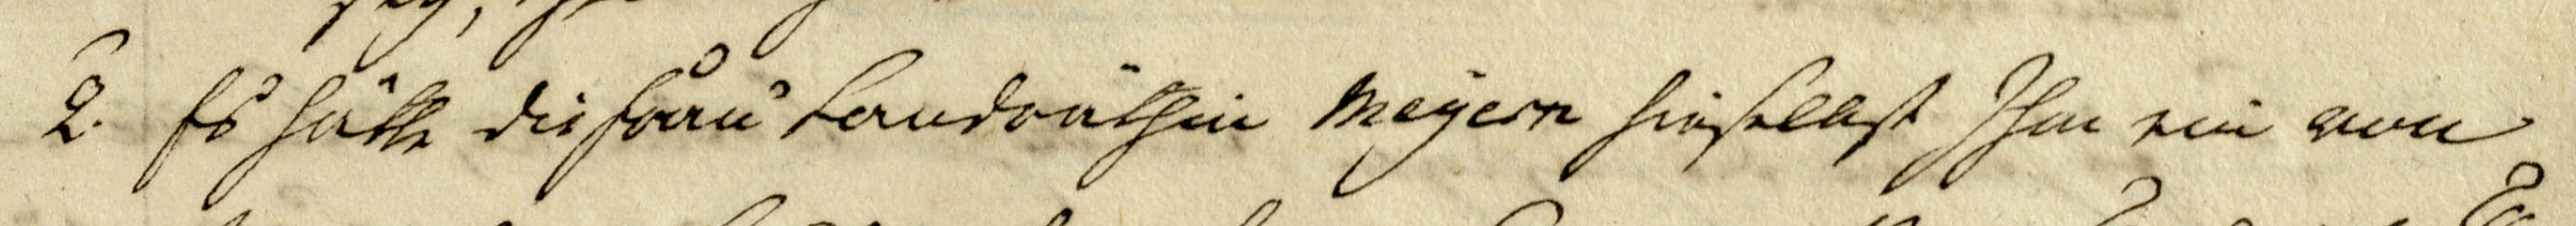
2 Es hätte die Frau Landräthin Meÿern hieselbst Ihm ein von
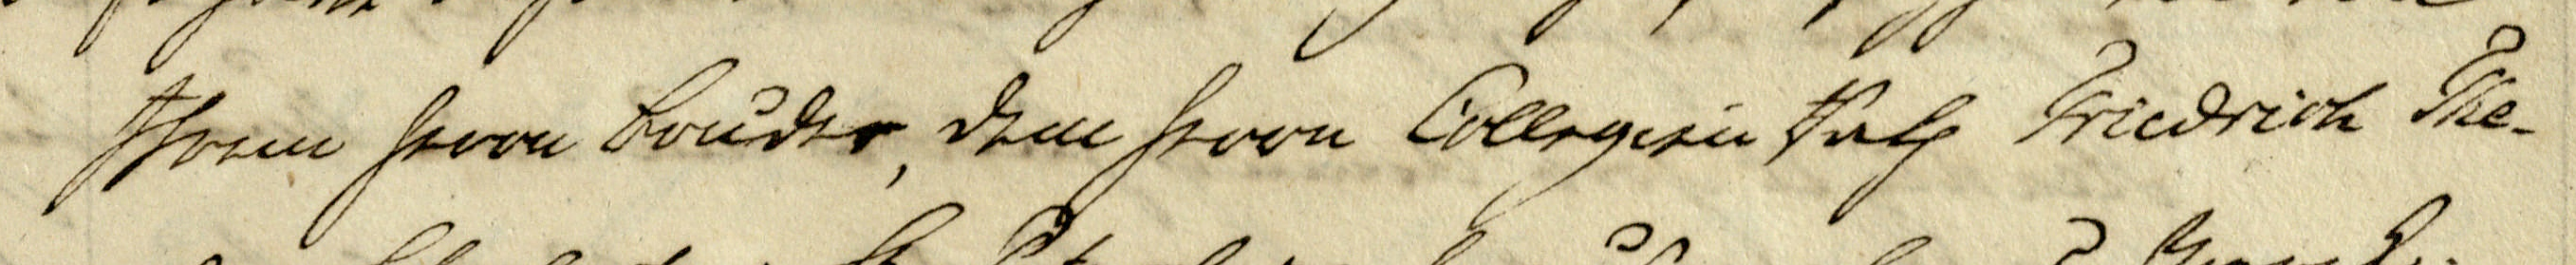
Ihrem Herrn Bruder, dem Herrn Collegien Rath Friedrich The¬
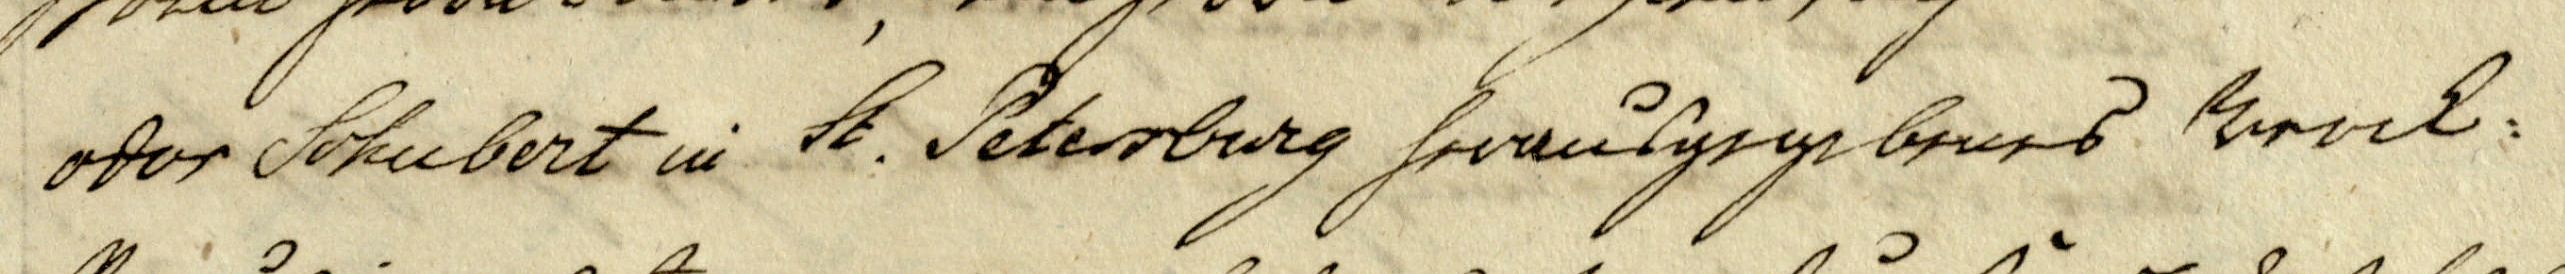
odor Schubert in St. Petersburg herausgegebenes Werck:
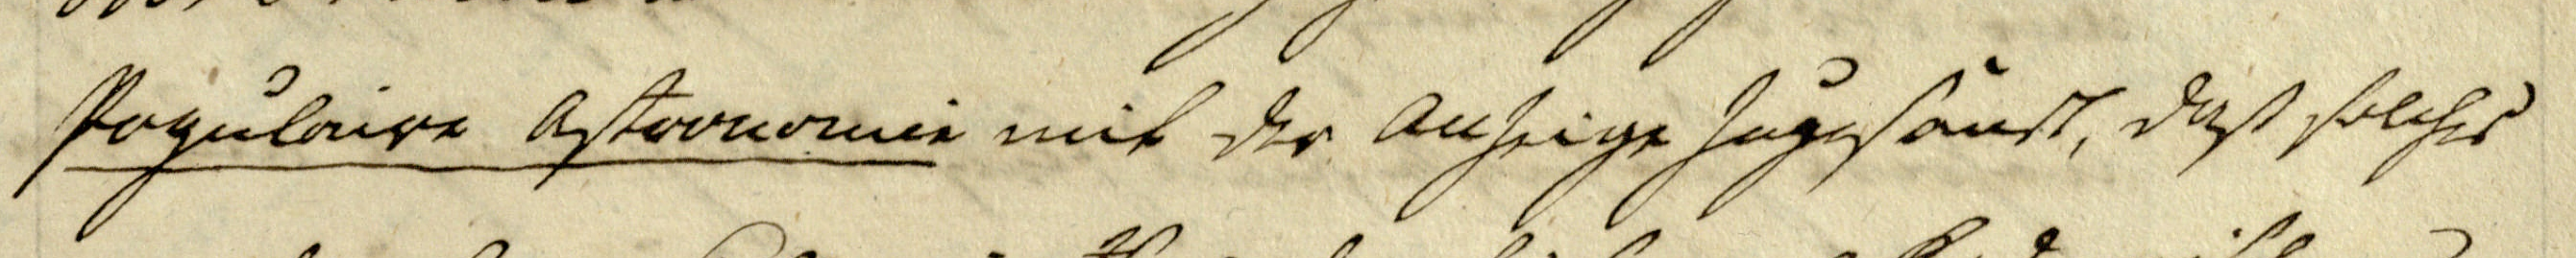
Populaire Astronomie mit der Anzeige zugesandt, daß solches
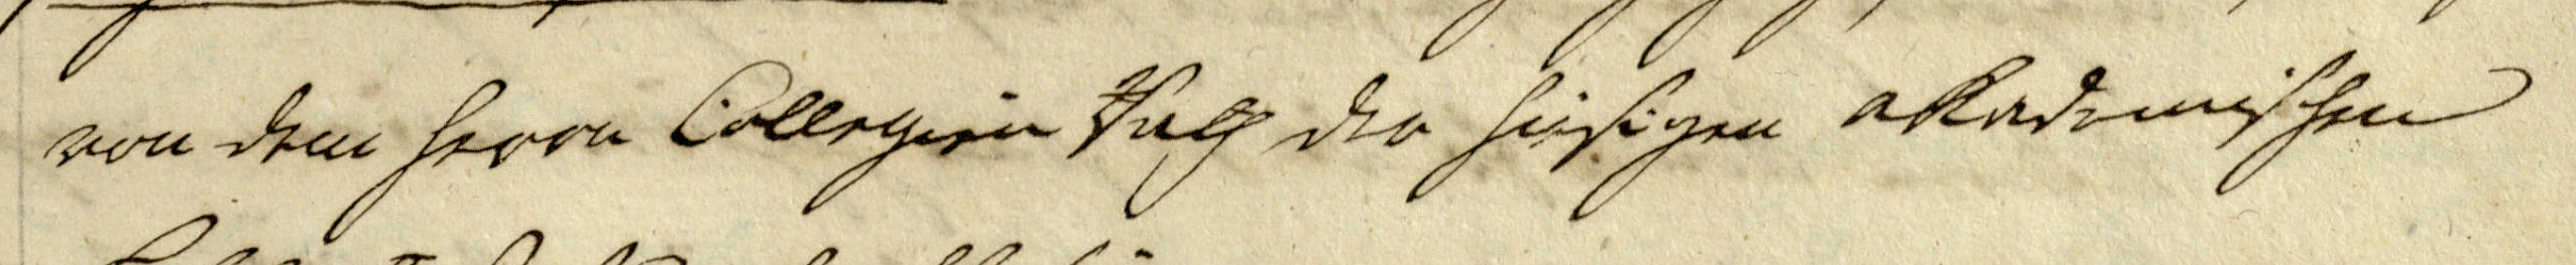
von dem Herrn Collegien Rath der hiesigen akademischen
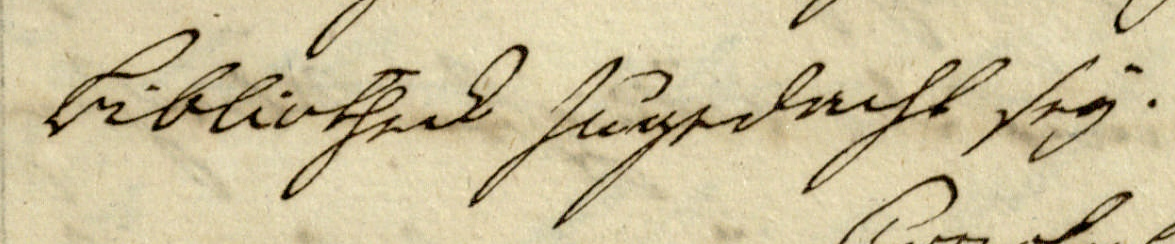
Bibliothek zugedacht seÿ.
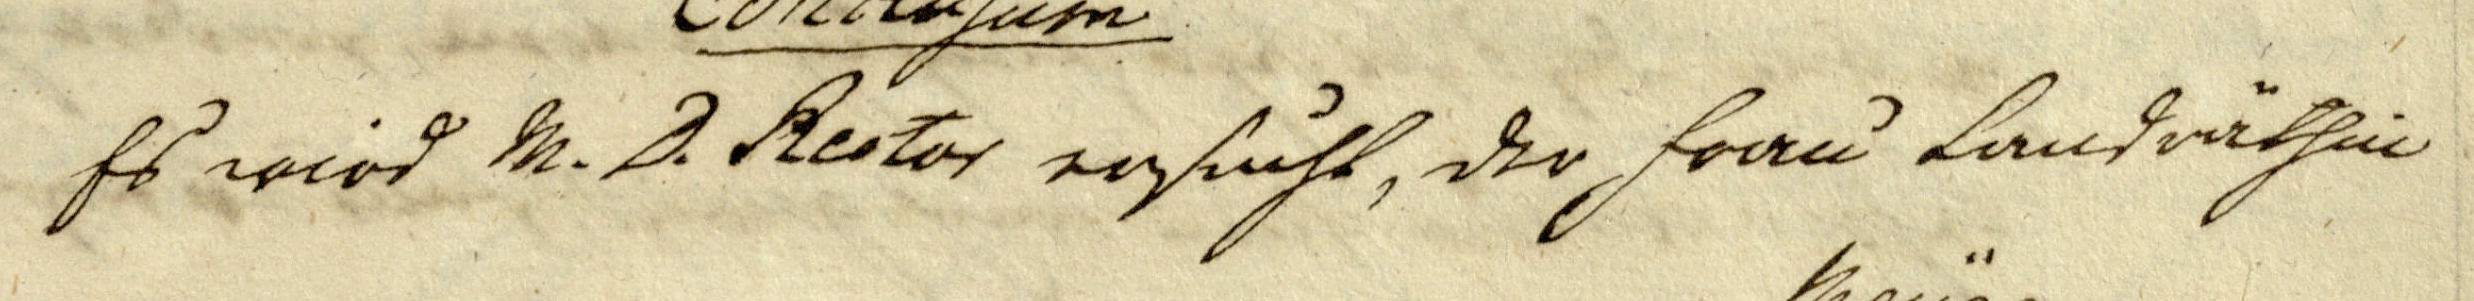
Es wird M. D. Rector ersucht, der Frau Landräthin
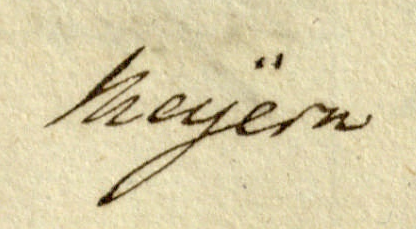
Meÿern
